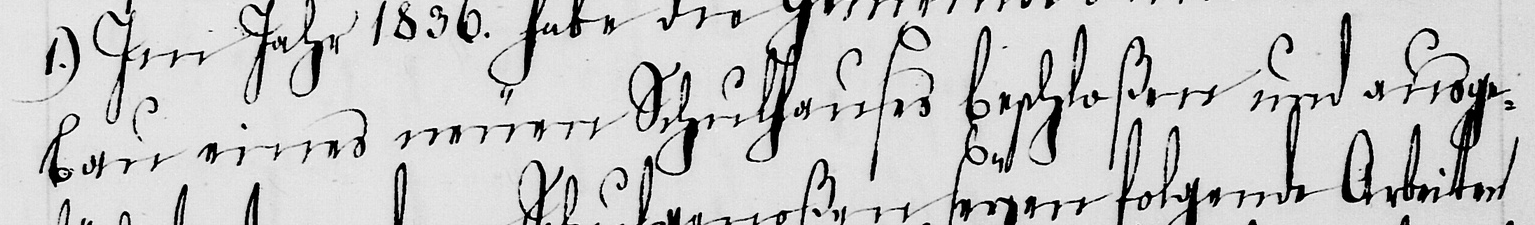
Bau eines neuen Schulhauses beschloßen und ausge¬
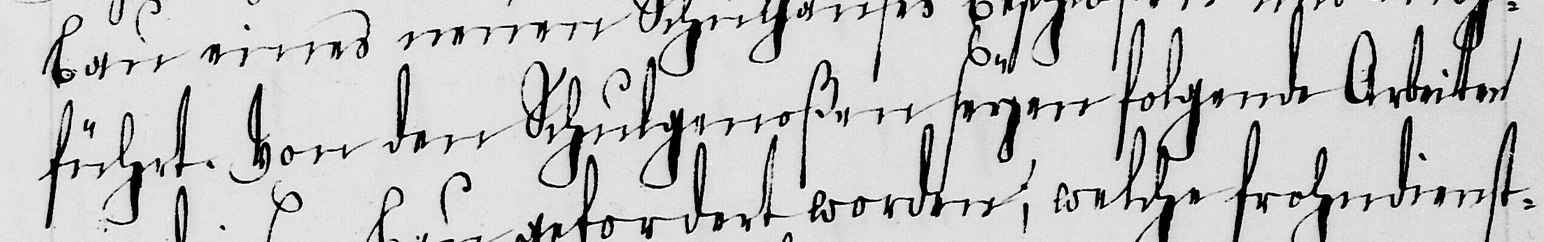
führt. Von den Schulgenoßen seyen folgende Arbeiten
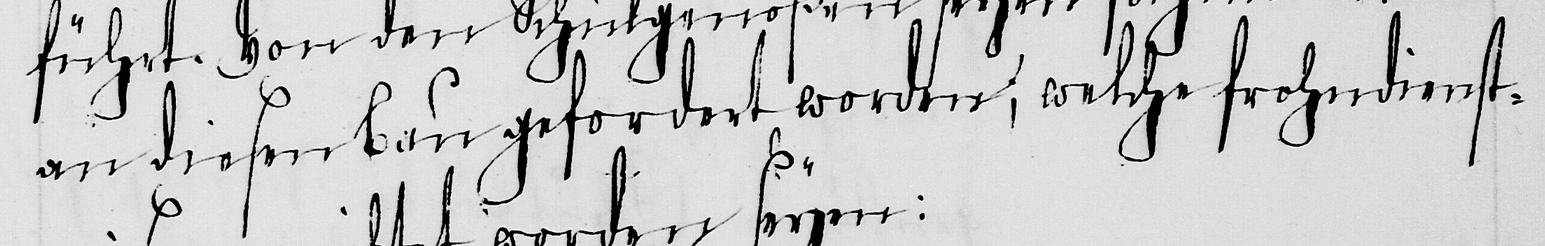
an diesen Bau gefordert worden; welche frohndienst¬
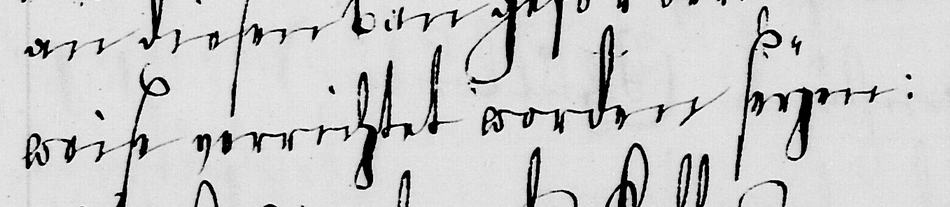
weise verrichtet worden seyen:
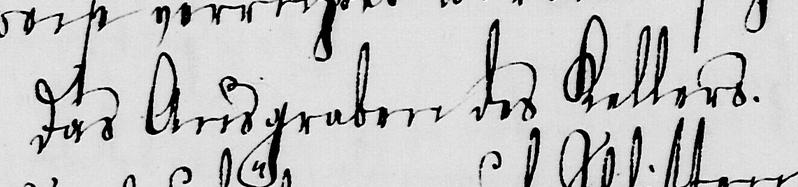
Das Ausgraben des Kellers.
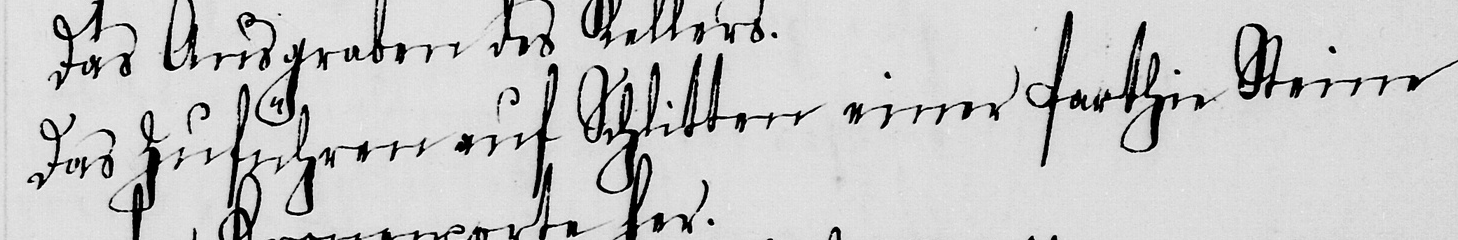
Das Zuführen auf Schlitten einer Parthie Steine
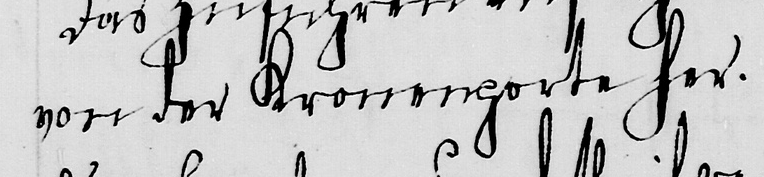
von der Kronenporte her.
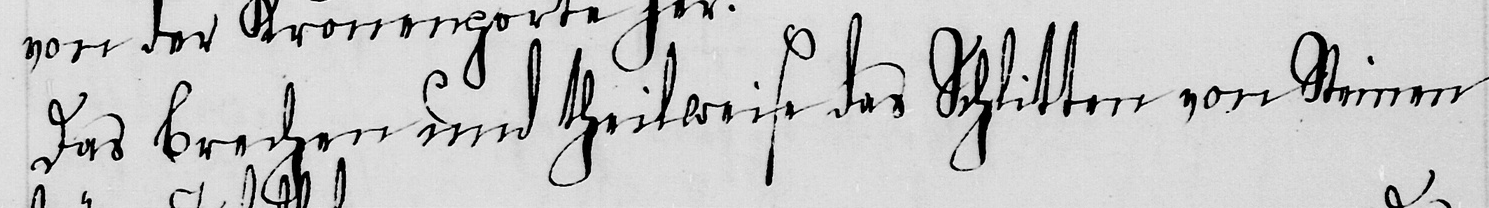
Das Brechen und theilweise das Schlitten von Steinen
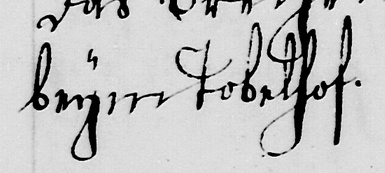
beym Tobelhof.
